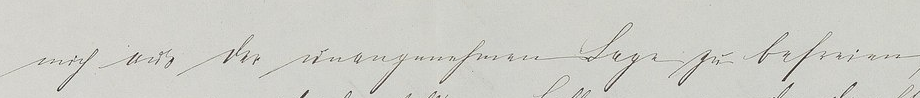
mich aus der unangenehmen Lage zu befreien,
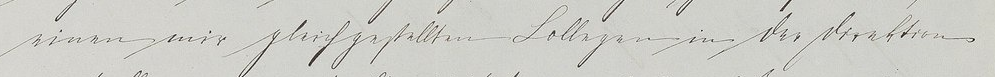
einen mir gleichgestellten Kollegen in der Direktion
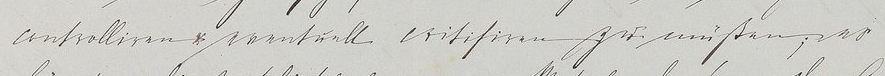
controlliren & eventuell critisiren zu müßen; es
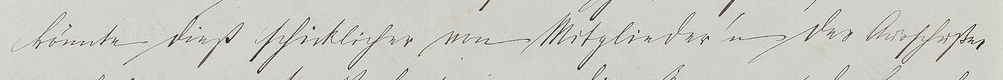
könnte dieß schicklicher von Mitglieder'n des Ausschußes
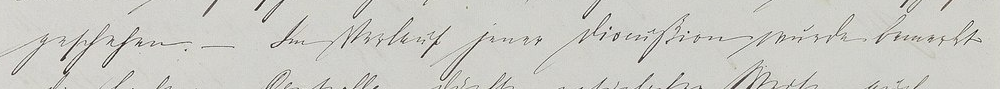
geschehen. – Im Verlauf jener Diskußion wurde bemerkt
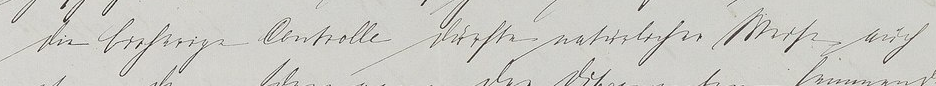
die bisherige Controlle dürfte natürlicher Weise auch
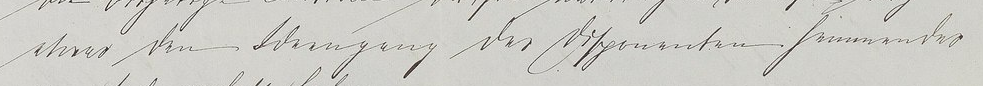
etwas den Ideengang des Disponenten hemmendes
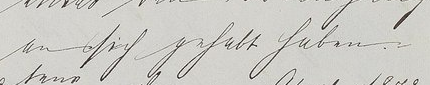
an sich gehabt haben. –
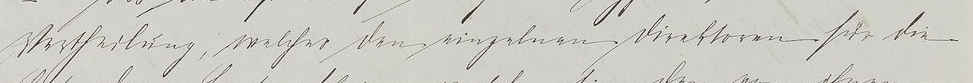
Vertheilung, welches den einzelnen Direktoren für die
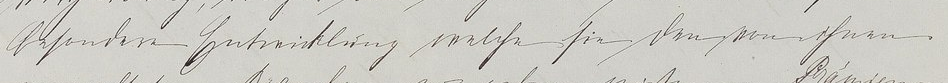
besondere Entwicklung welche sie den von ihnen
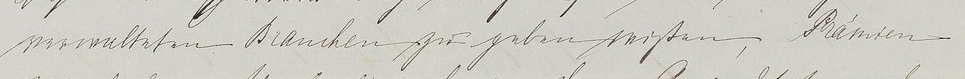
verwalteten Branchen zu geben wißen, Prämien
